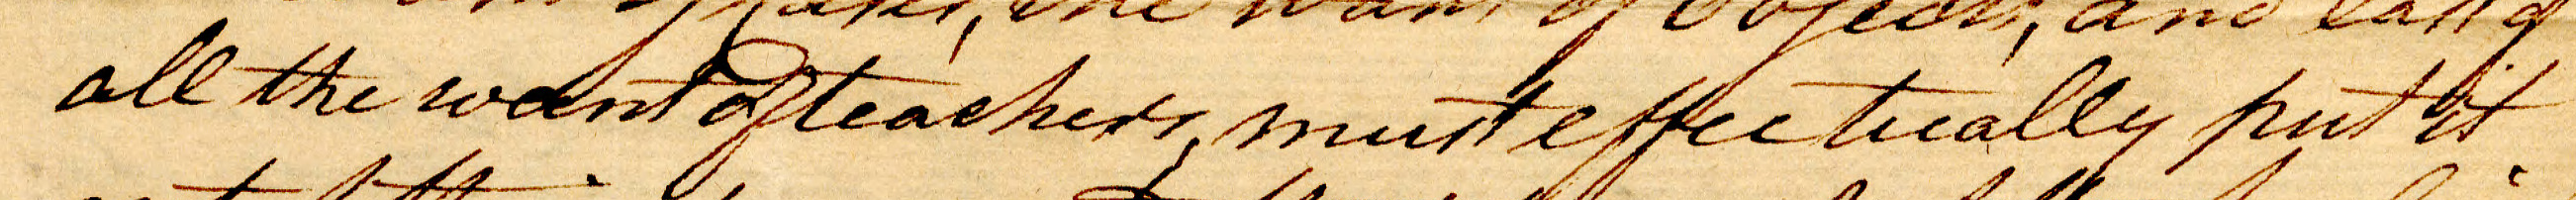all the want of teachers, must effectually put it
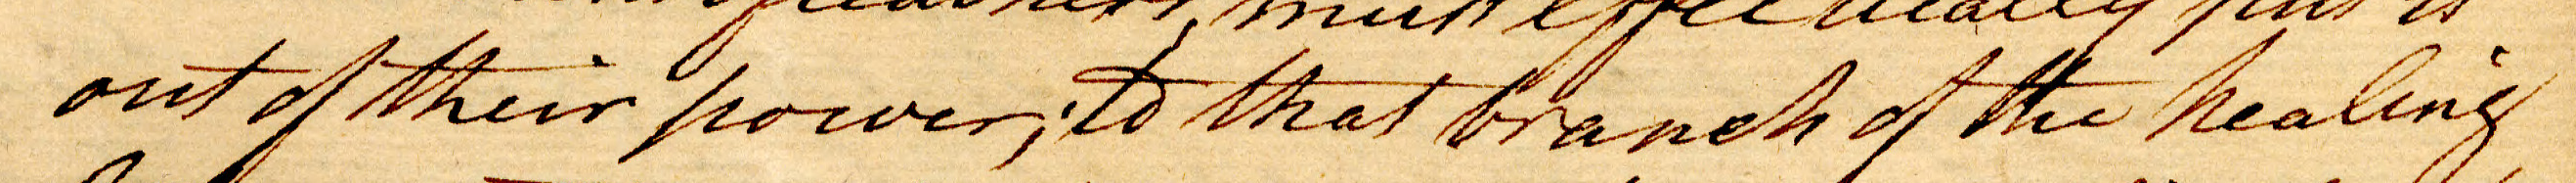out of their power; to that branch of healing
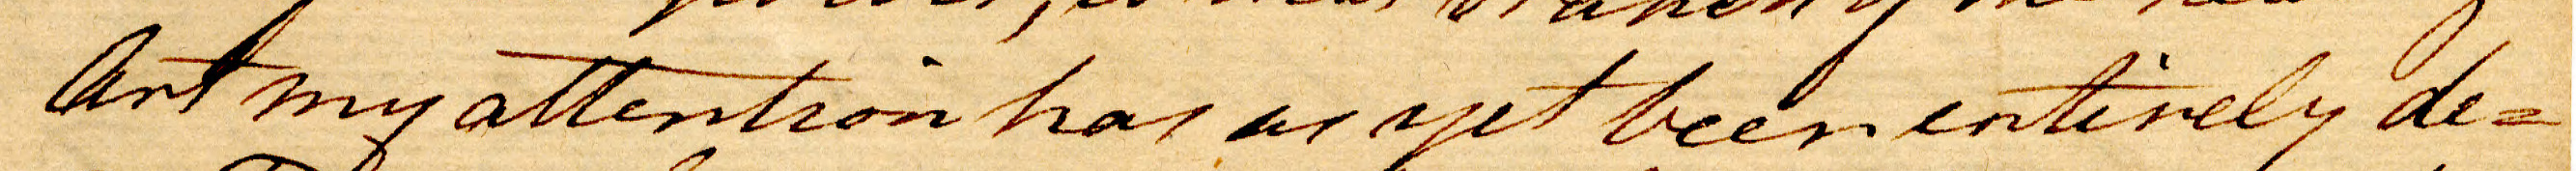Art my attention has as yet been entirely de-
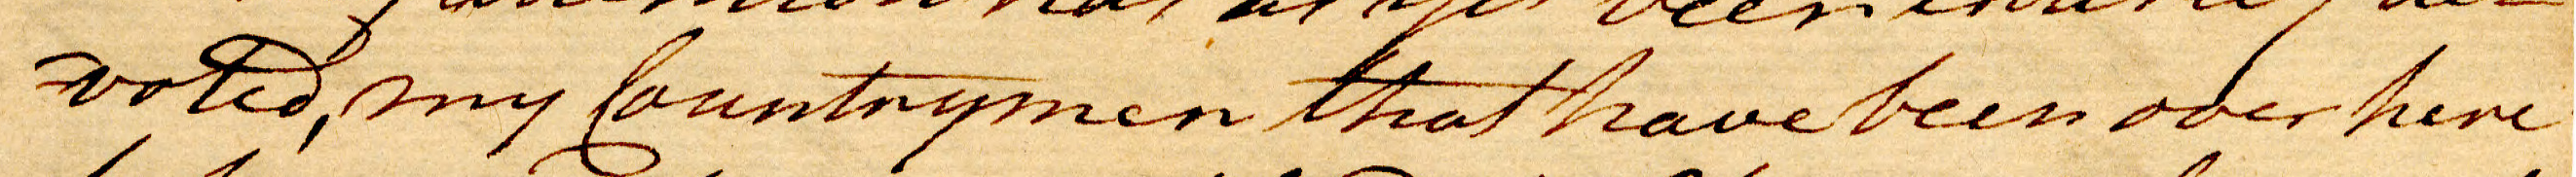-voted, my Countrymen that have been over here
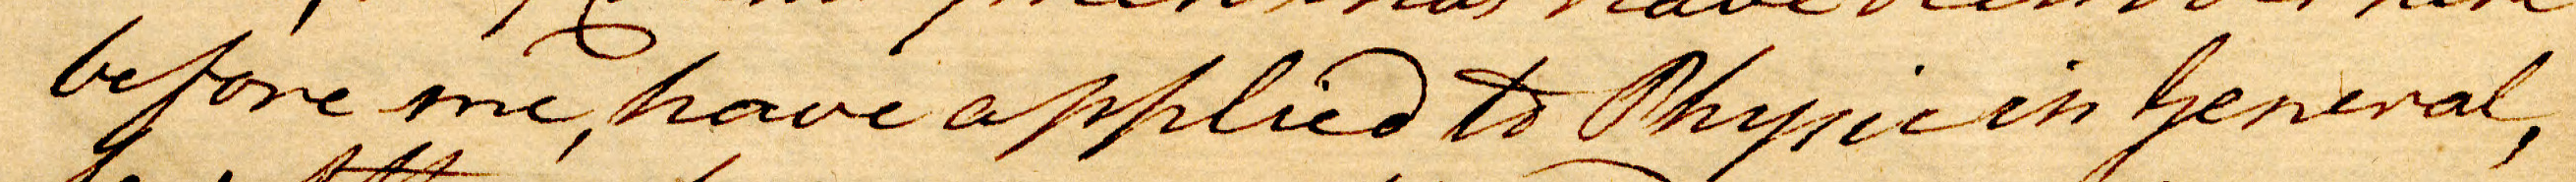before me, have applied to Physic in General,
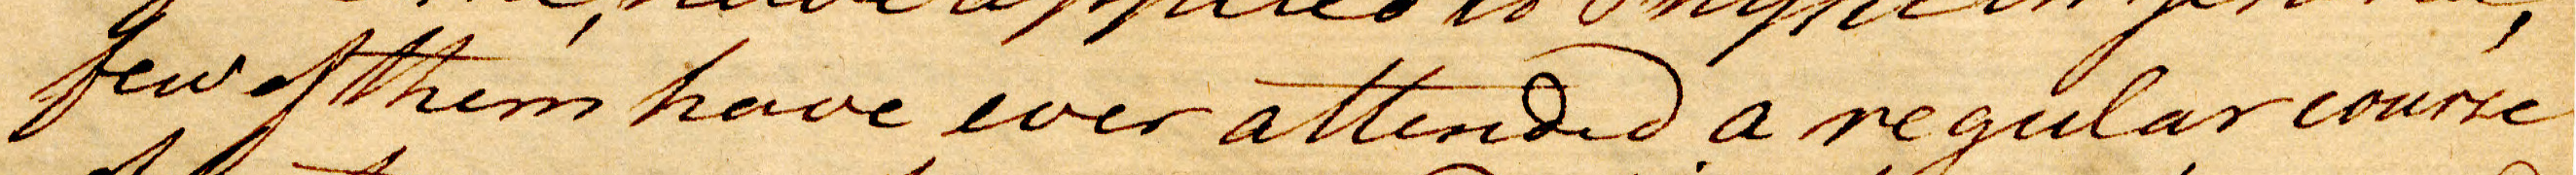few of them have ever attended a regular course
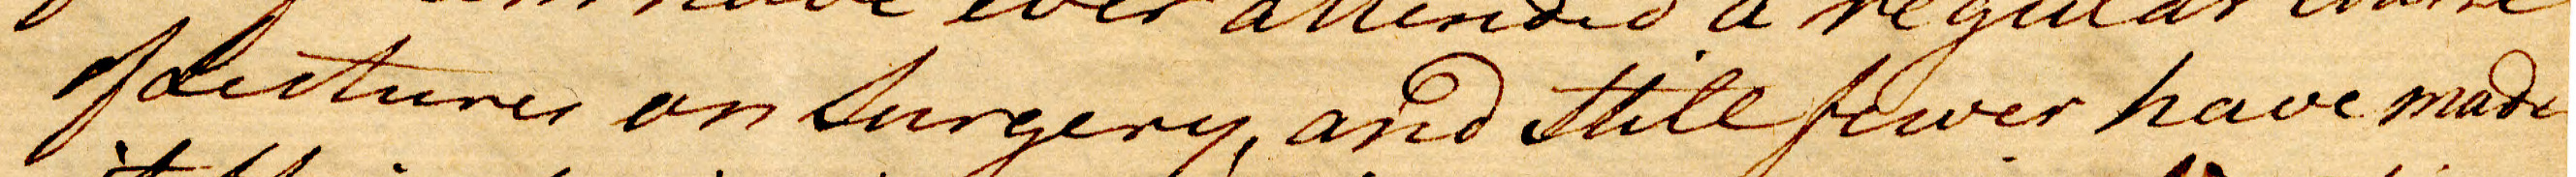of Lectures on Surgery, and still fewer have made
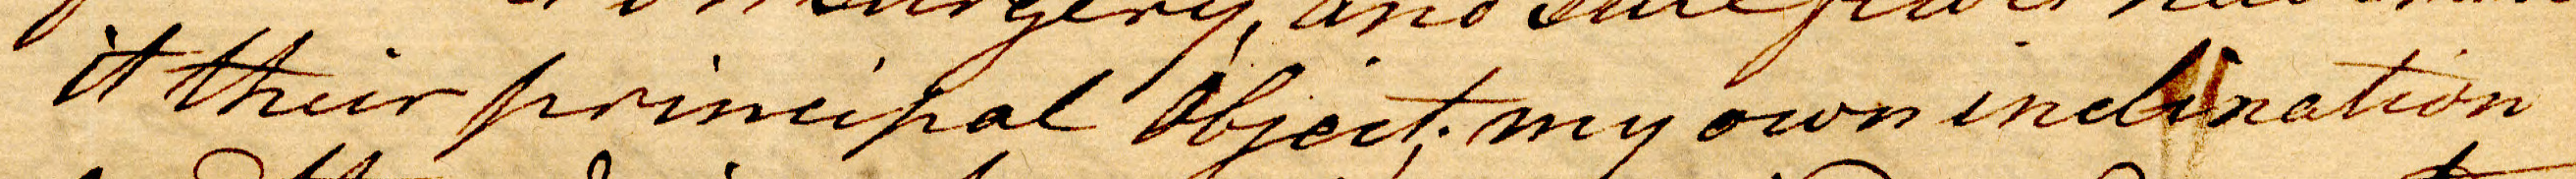it their principal Object, my own inclination
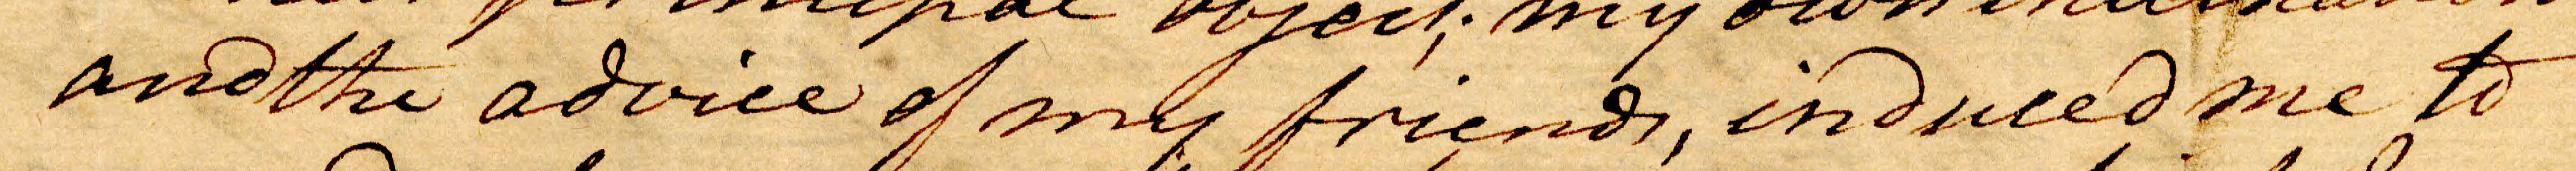and the advice of my friends, induced me to
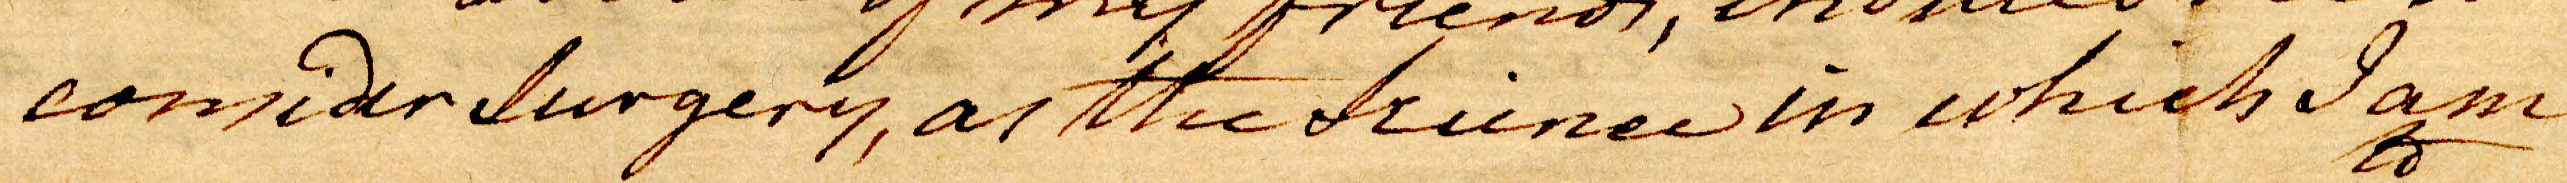consider Surgery, as the Science in which I am
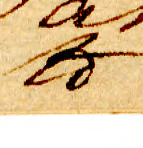to
